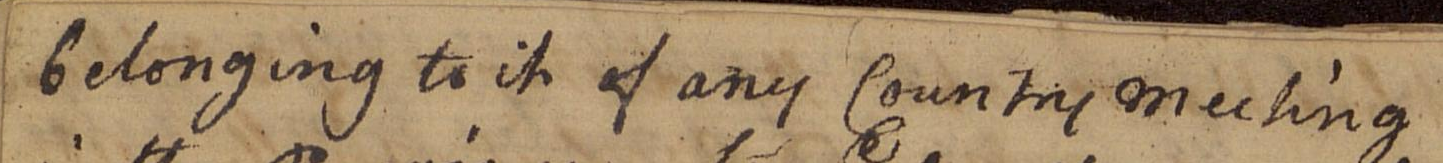belonging to it if any Country meeting
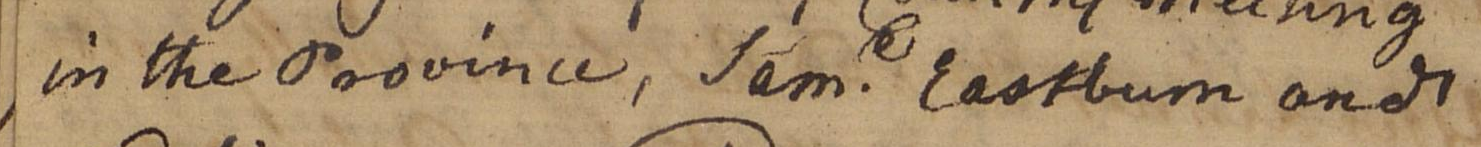in the Province, Sam^l. Eastburn and
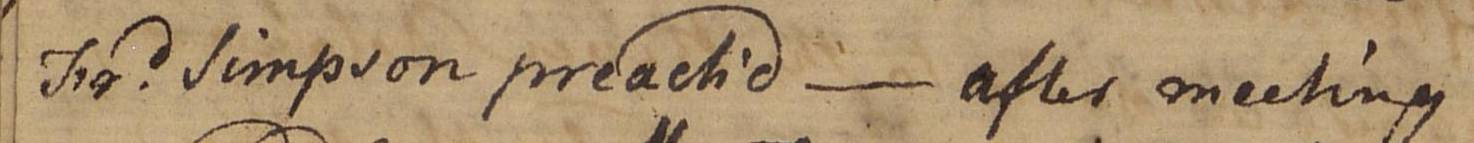Fr^d. Simpson preach'd- after meeting
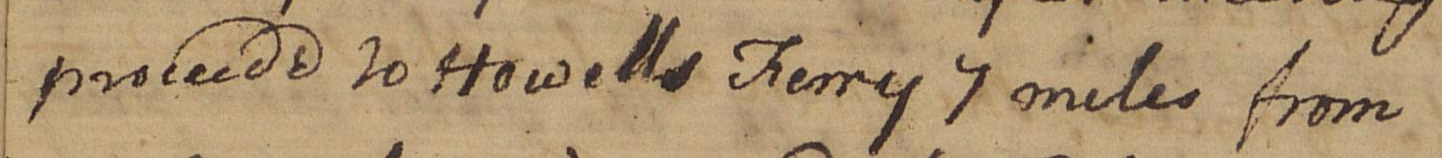proceed'd to Howells Ferry 7 miles from
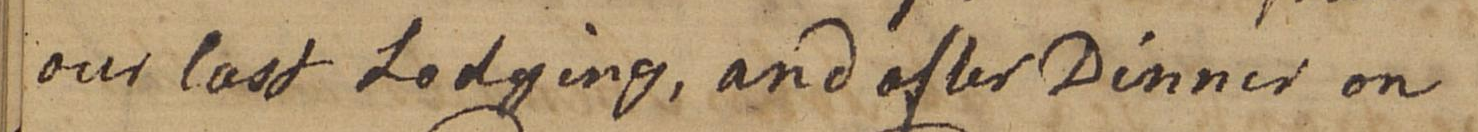our last Lodging, and after Dinner on
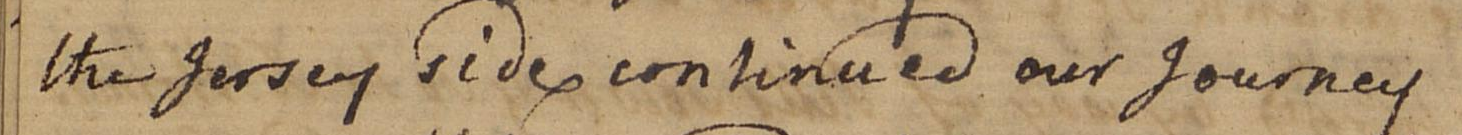the Jersey side continued our Journey
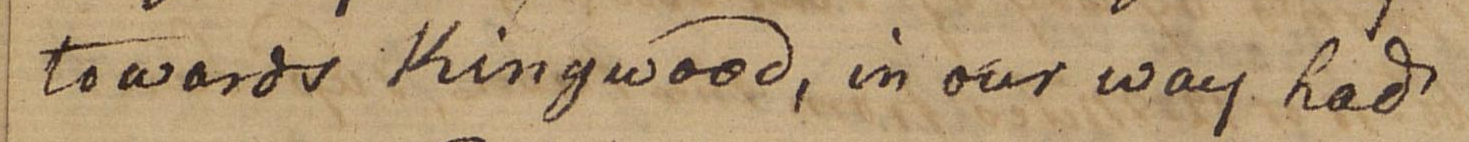to wards Kingwood, in our way had
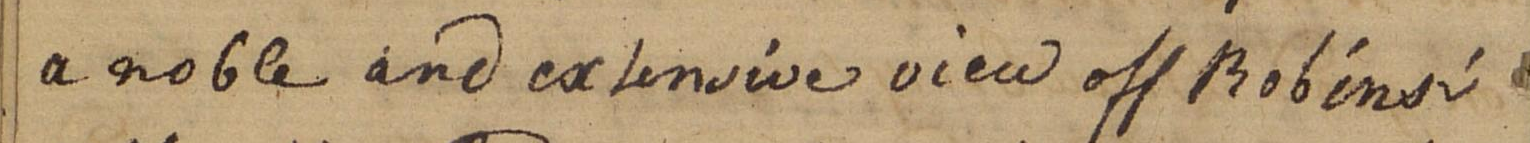a noble and extensive view off Robins's
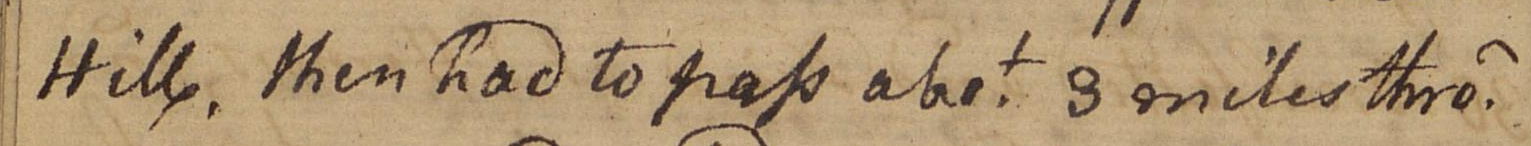Hill, then had to pass abo^t 3 miles thro'
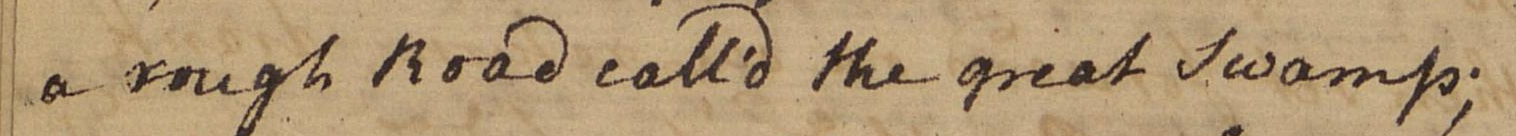a rough Road call'd the great Swamp;
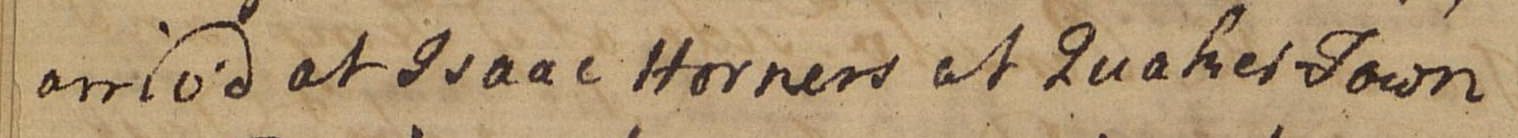arriv'd at Isaac Horners at Quaker Town
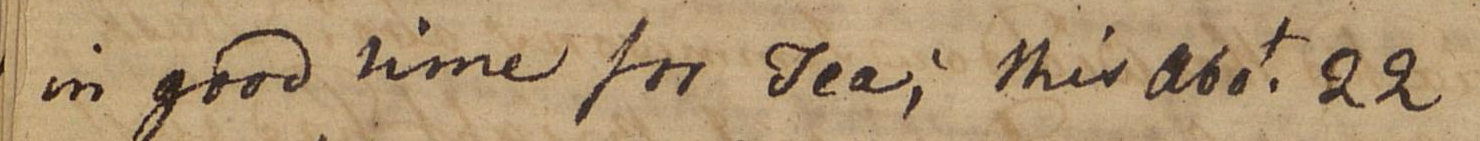in good time for Tea; this abo^t. 2 2
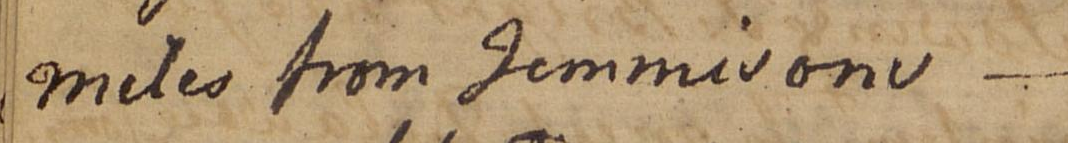miles from Jemmisons-
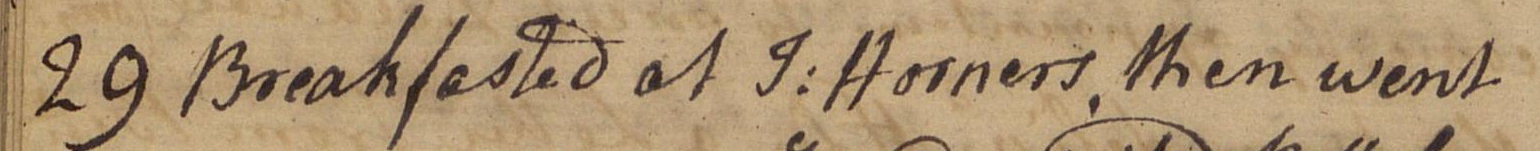29 Breakfasted at I: Horners then went
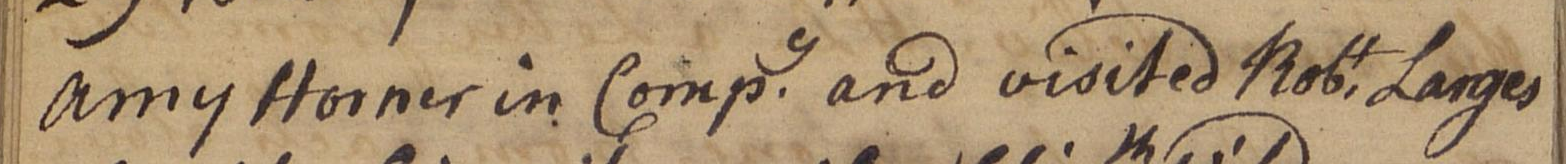Amy Horner in Comp^y. and visited Rob^t. Larges
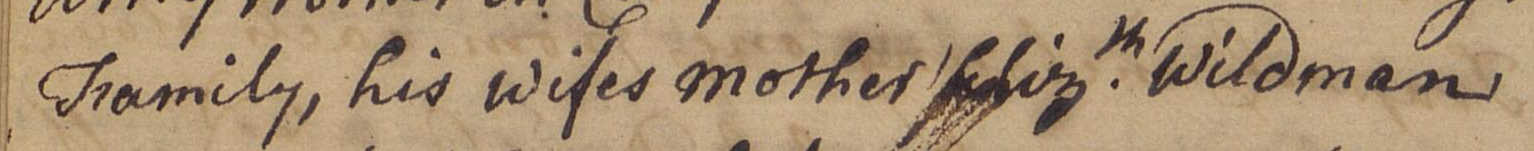Family, his wifes mother Eliz^th. Wildman
